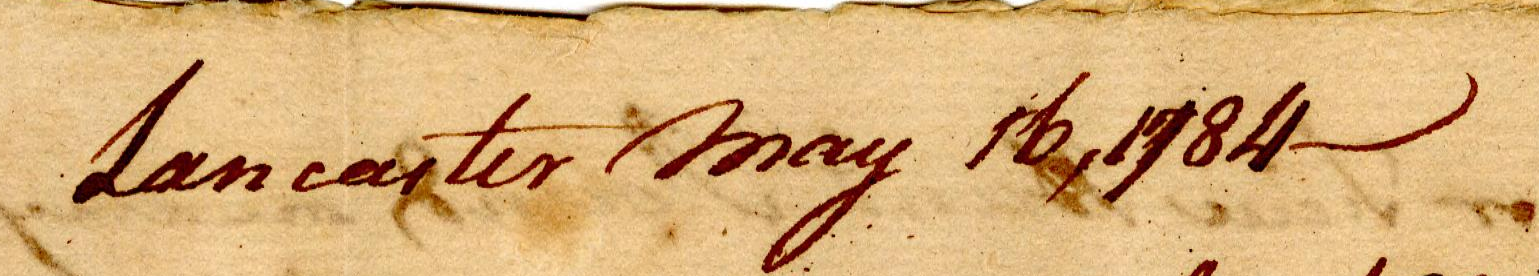Lancaster May 16, 1784
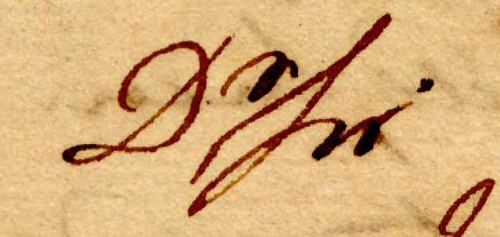D^r Sir
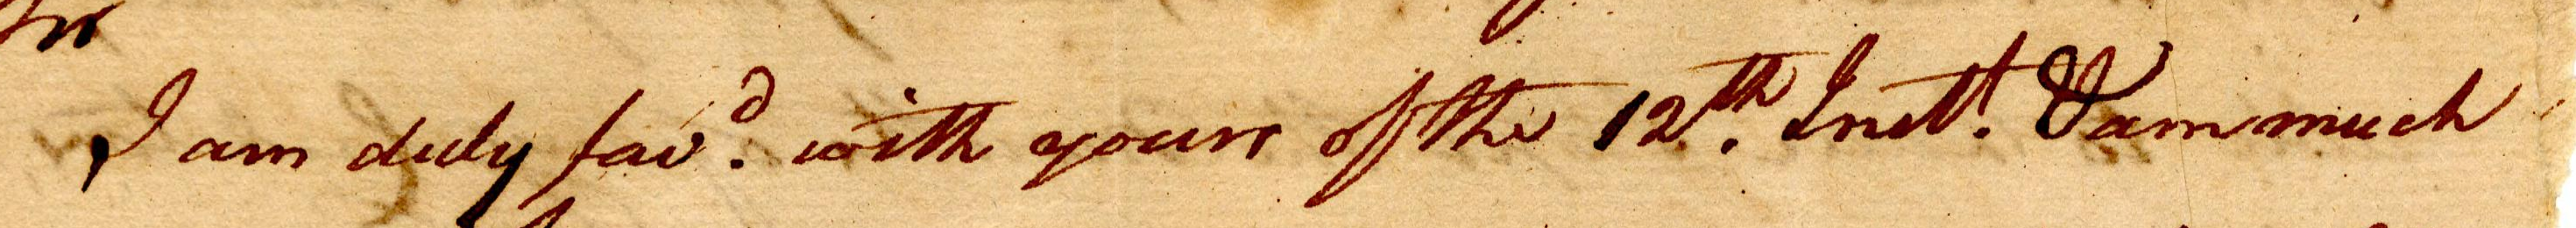I am duly fav^d. with yours of the 12^th. Inst^t. & am much
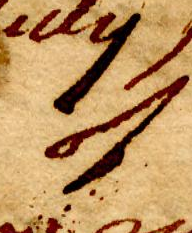of
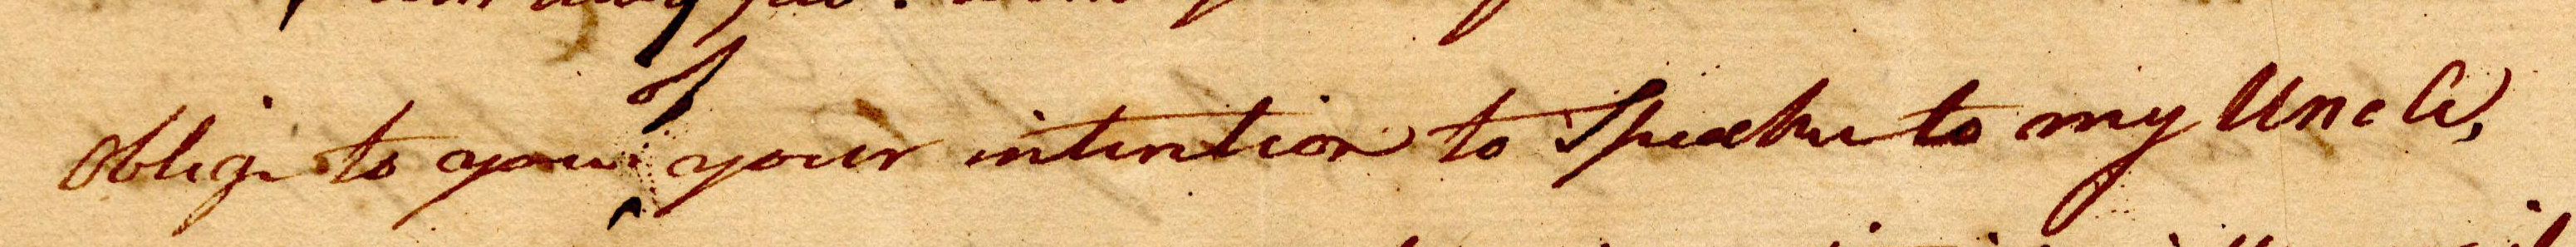oblige to yours ^ your intention to speake to my Uncle,
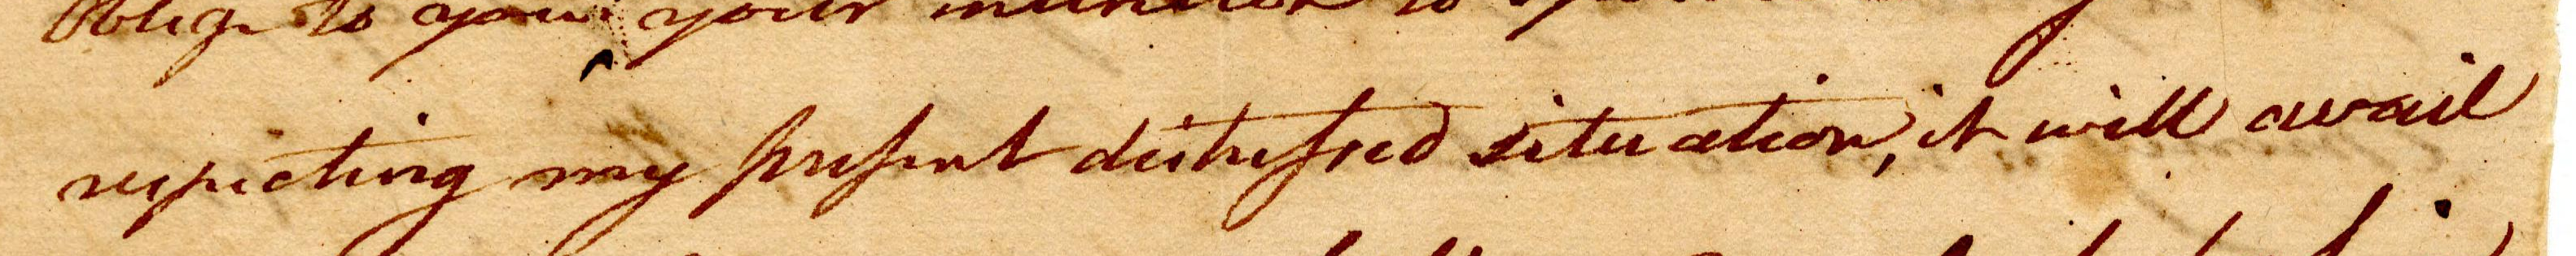respecting my present distressed situation, it will avail
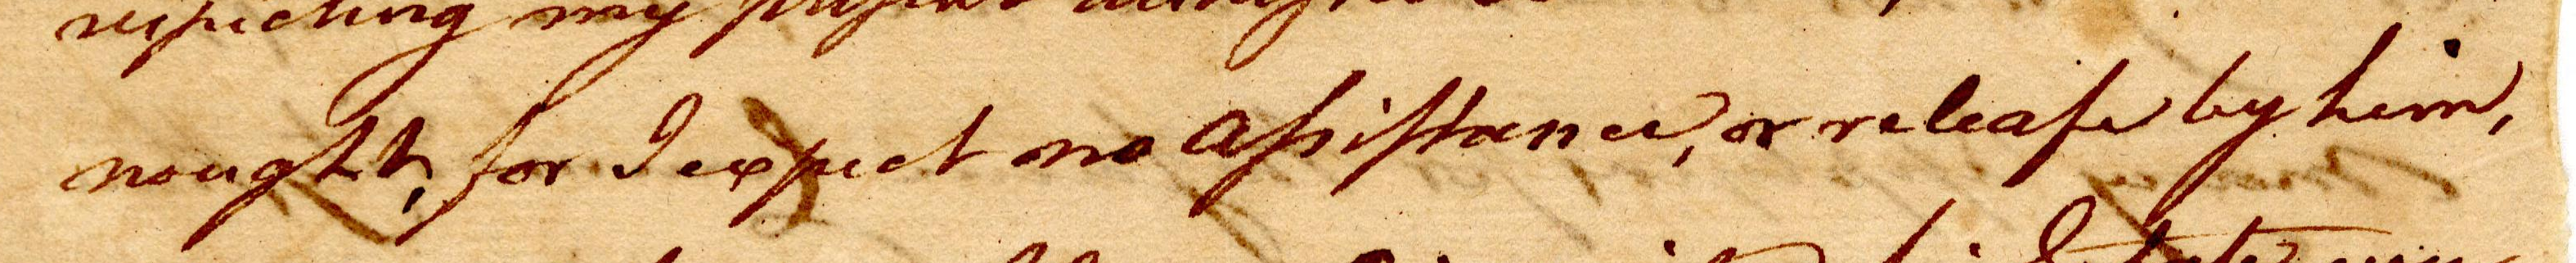nought for I expect no assistance, or release by him,
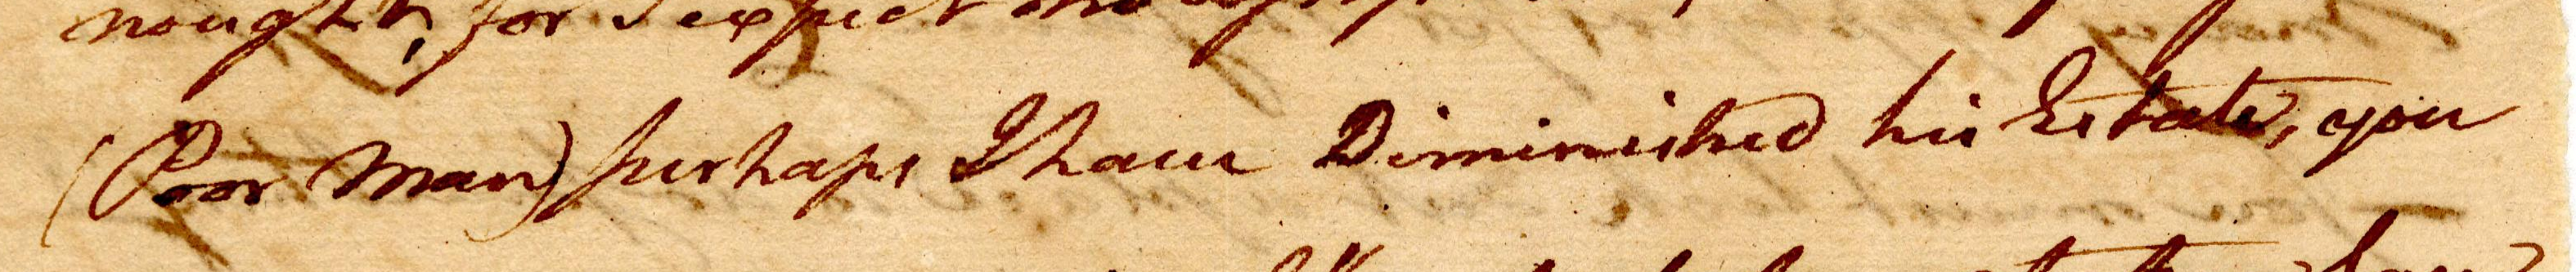(Poor man) perhaps I have Diminished his Estate, you
